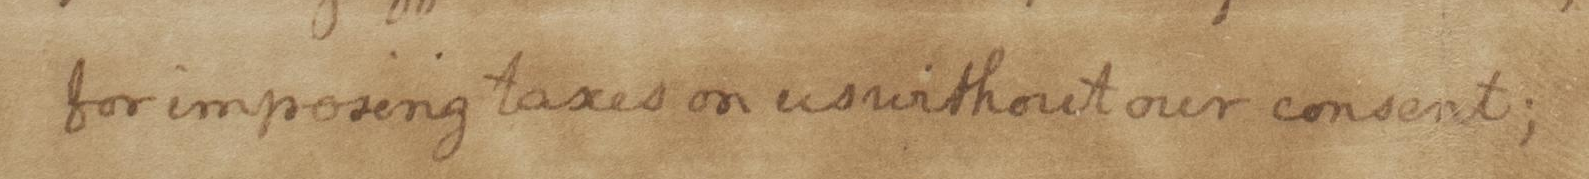for imposing taxes on us with out our consent;
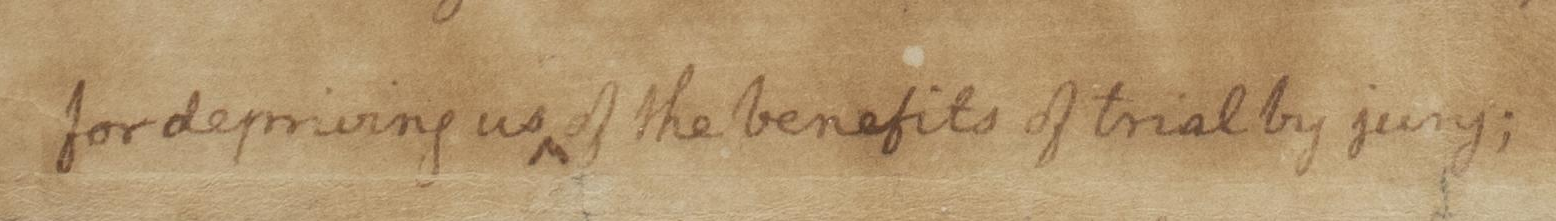for depriving us, of the benefits of trail by jury;
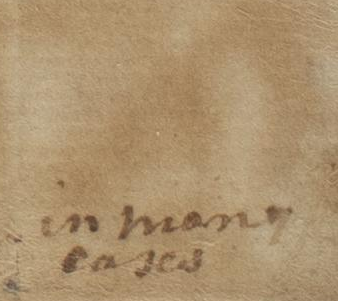in many
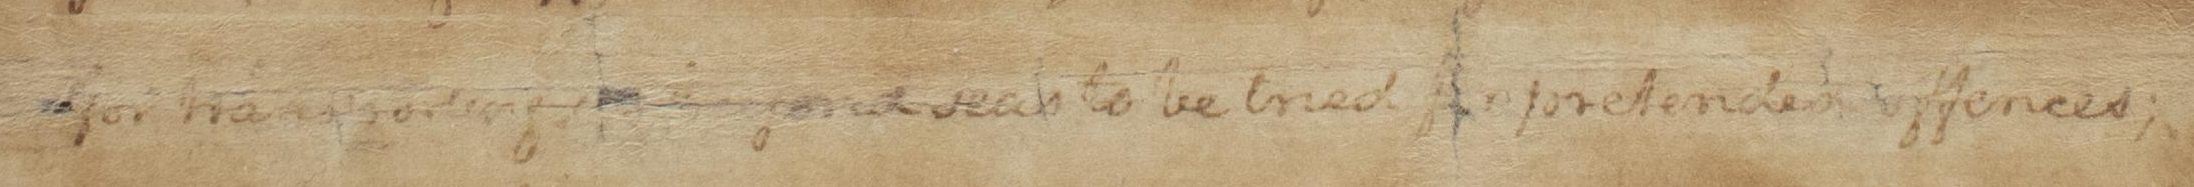For transporting us beyond Seas to be tried for pretended offences;
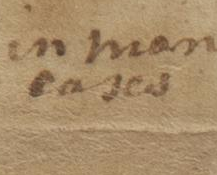cases
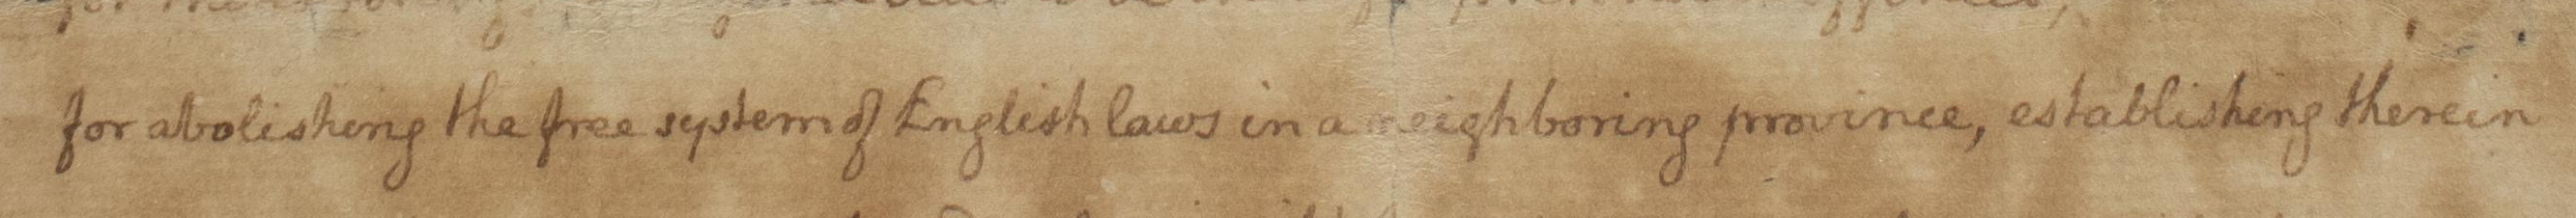for abolishing the free system of English laws in a neighboring province, establishing therein
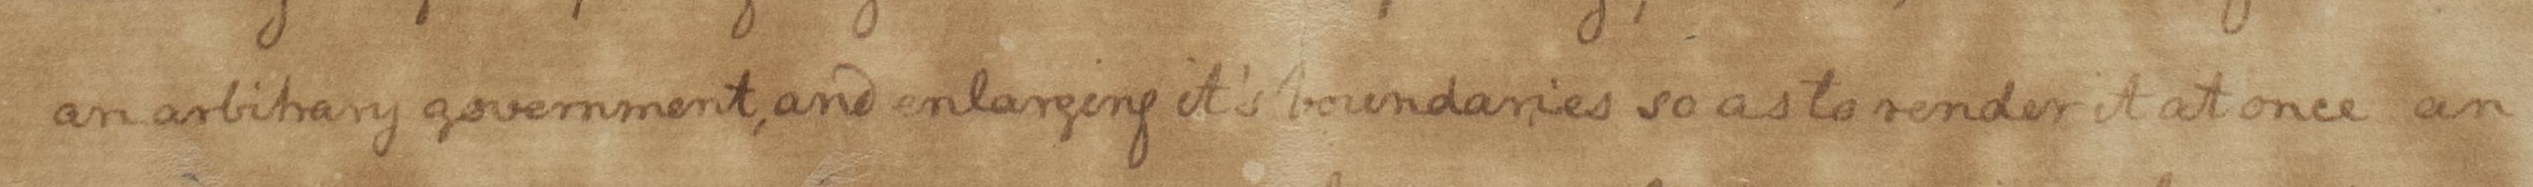an arbitrary government, and enlarging it's boundaries so as to render it at once an
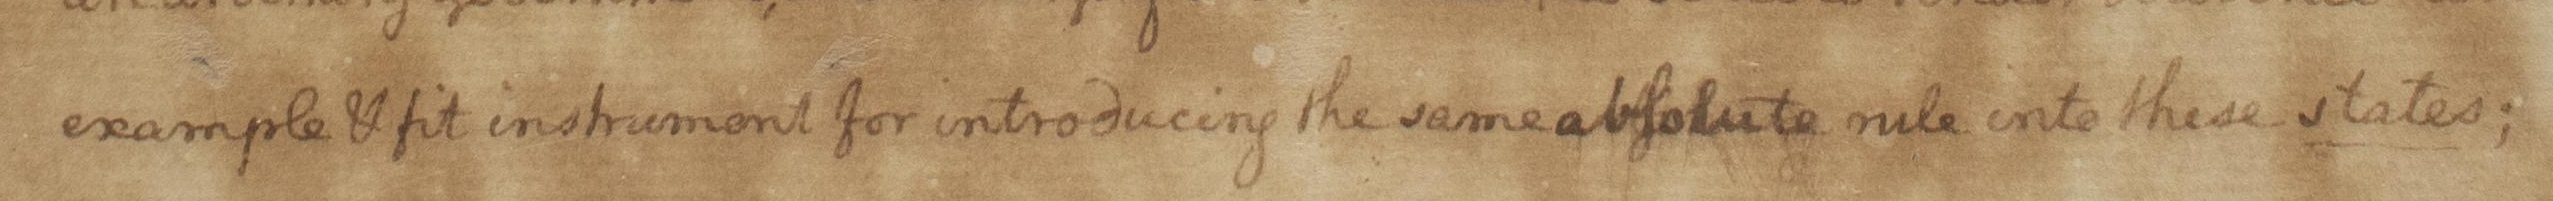example & fit instrument for introducing the same absolute rule into these states;
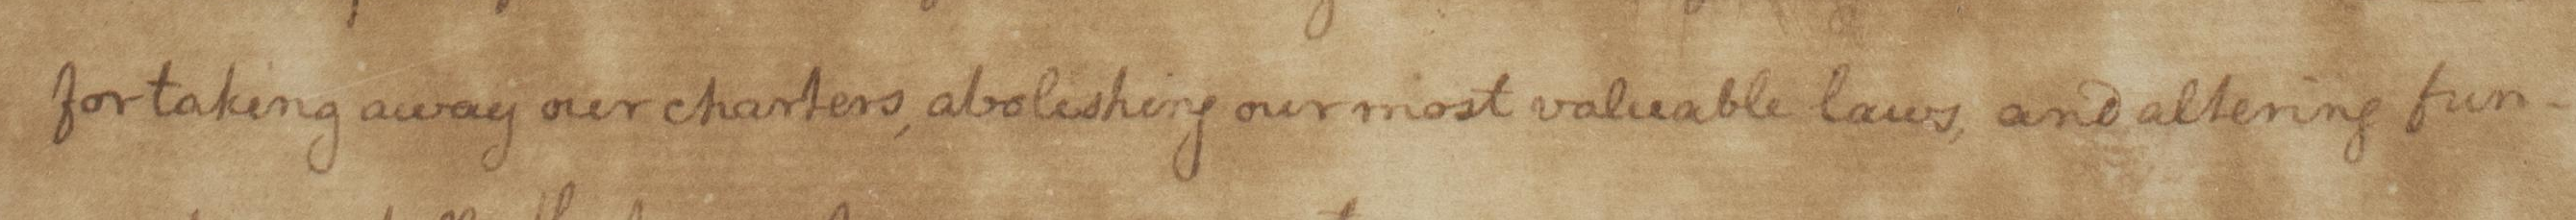for taking away our charters, abolishing our most valuable laws, and altering fun-
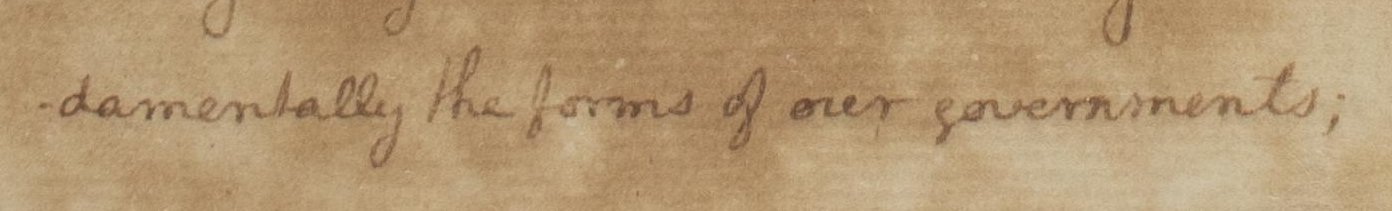-damentally the forms of our governments;
